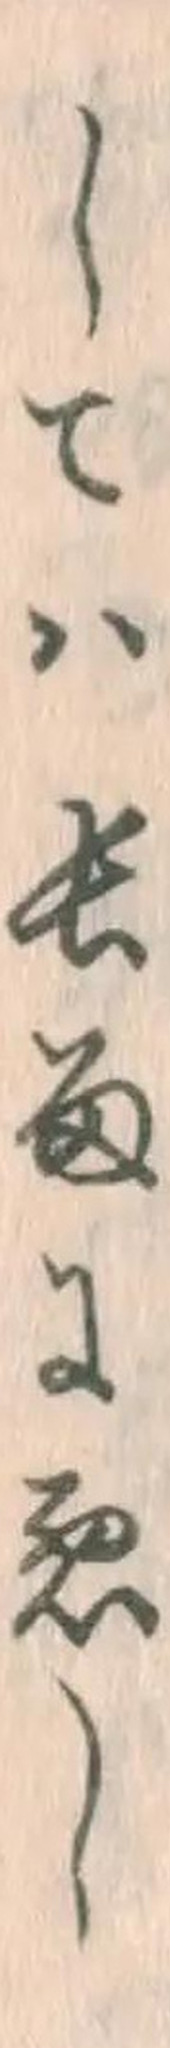しては長雨に悪し
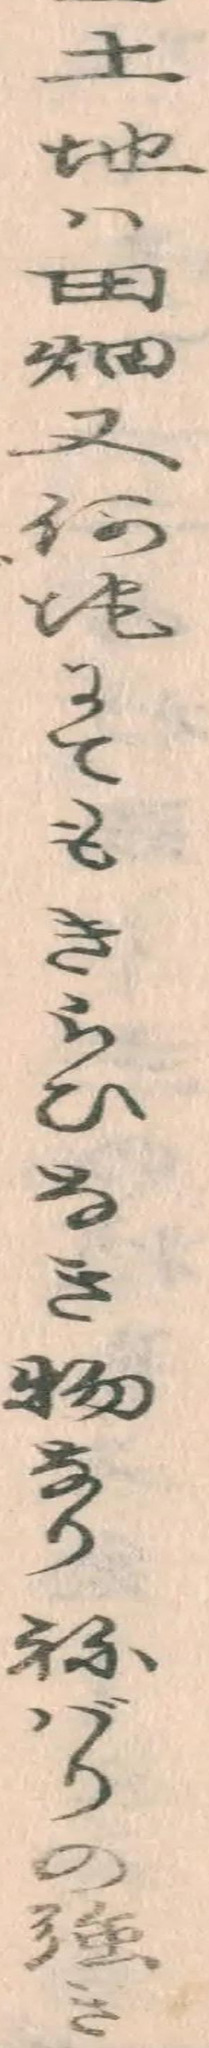一土地は田畑又何地にてもきらひなき物なりねばりの強き
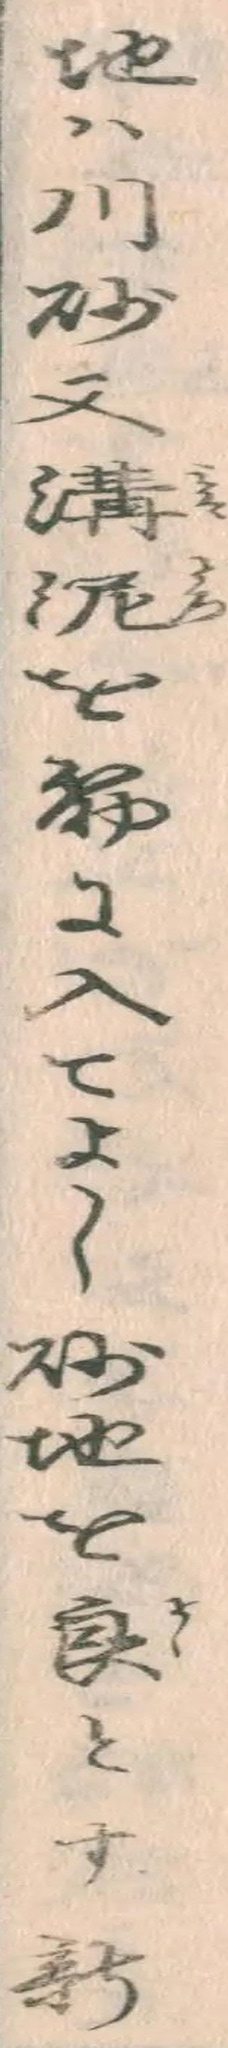地は川砂又溝泥を筋に入てよし砂地を良とす新
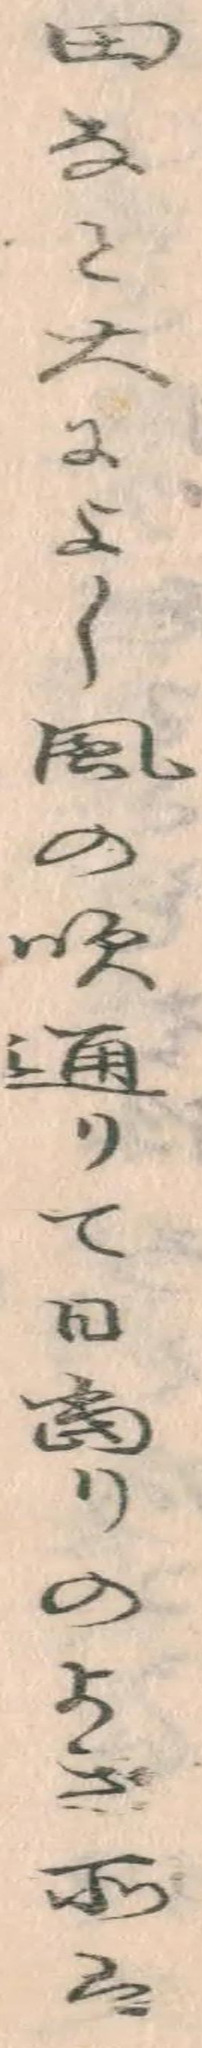田なと大によし風の吹通りて日当りのよき所は
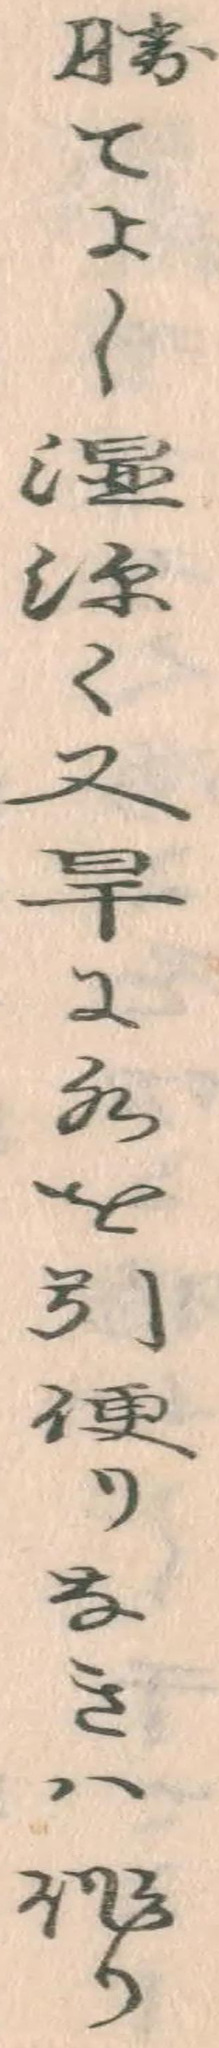勝てよし湿深く又旱に水を引便りなきは作り
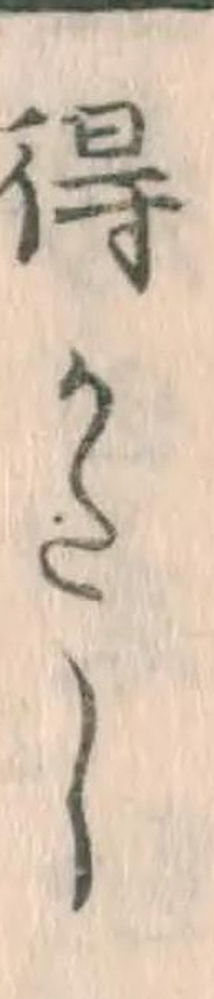得かたし
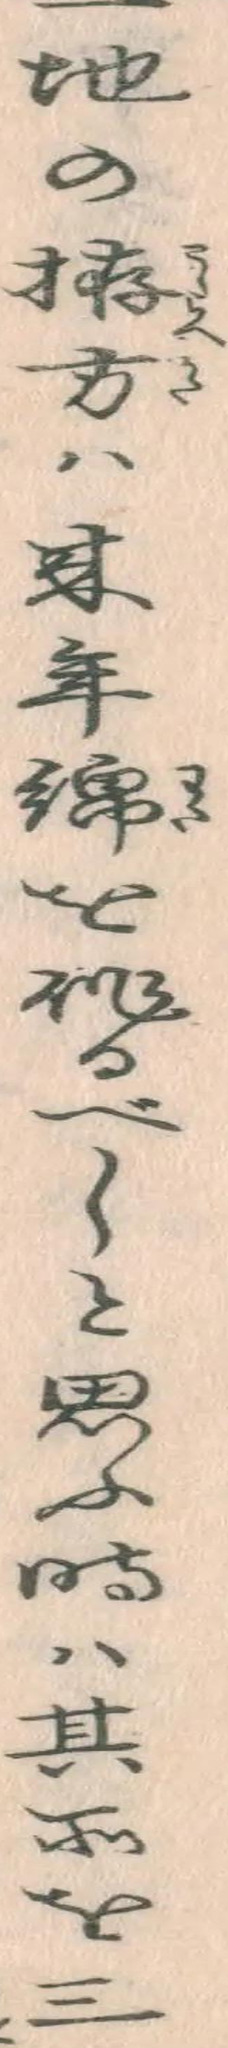一地の拵方は来年綿を作るべしと思う時は其所を三
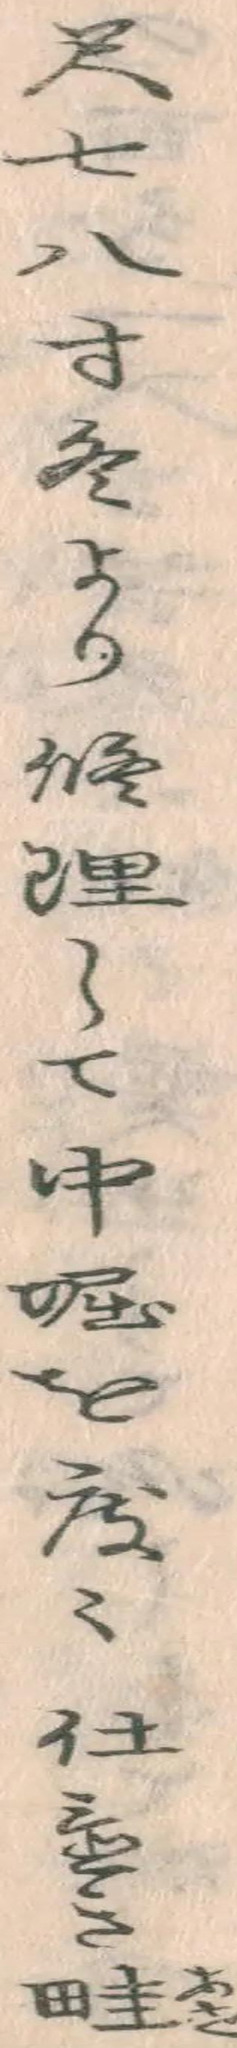尺七八寸冬より修理して中堀を度々仕置き畦
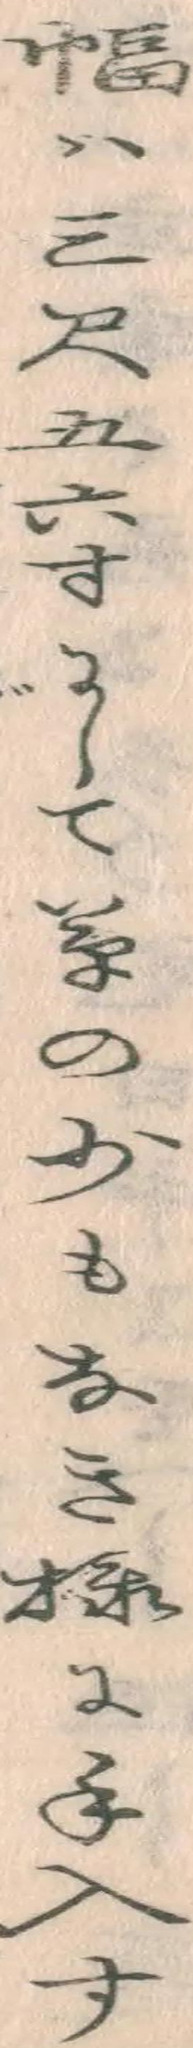幅は三尺五六寸にして草の少もなき様に手入す
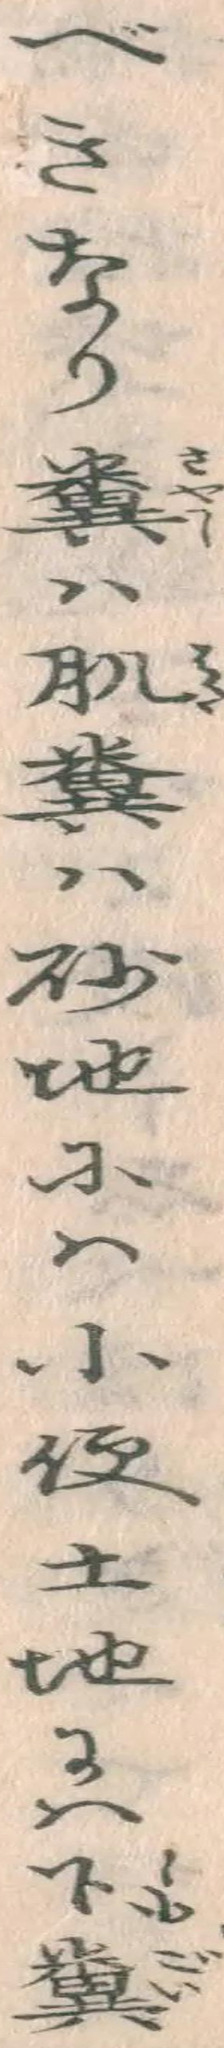べきなり糞は肌糞は砂地には小便土地には下糞
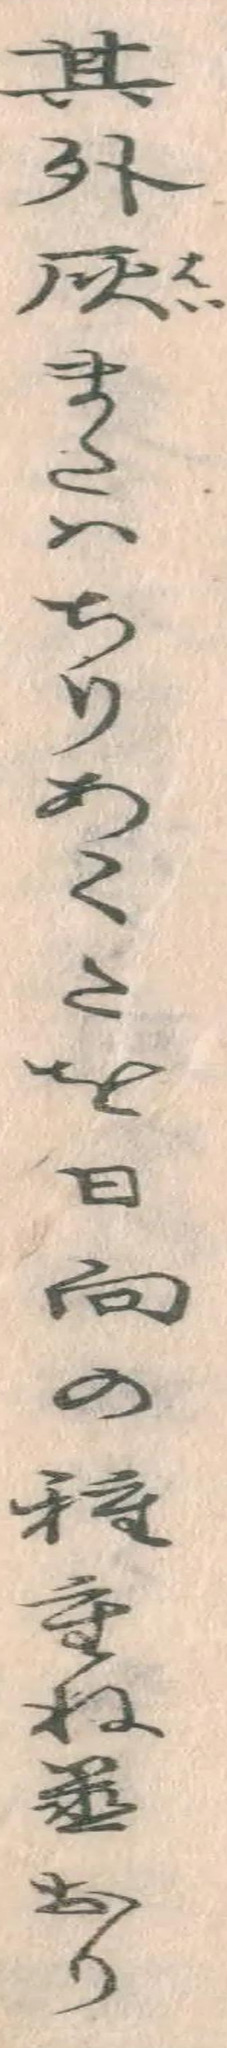其外灰またはちりあくたを日向の種重ね置おり
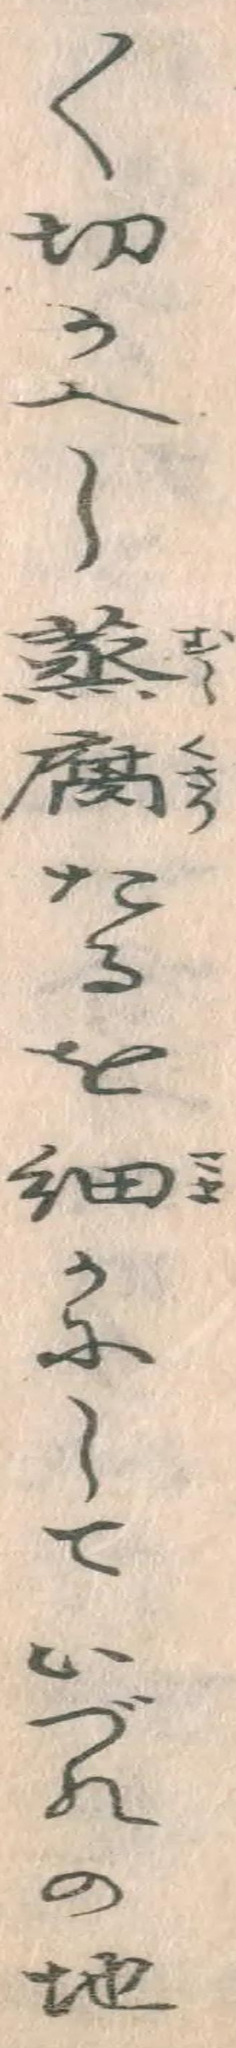〳〵切かへし蒸腐たるを細かにしていづれの地
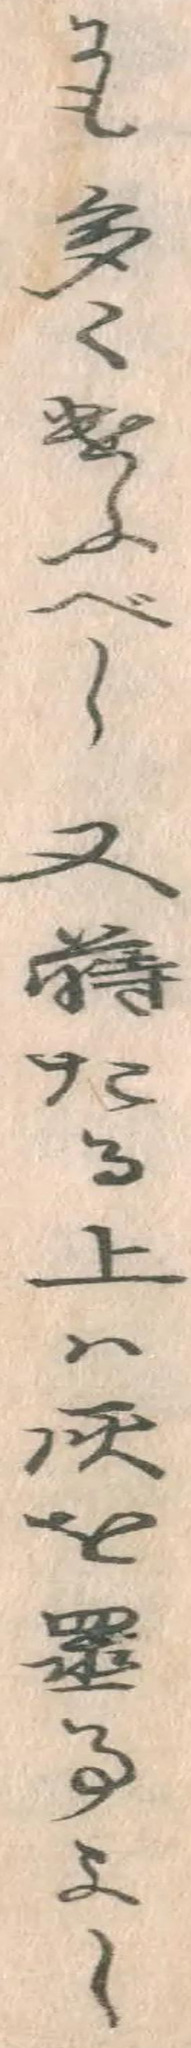にも多く遣ふべし又蒔たる上は灰を置事よし
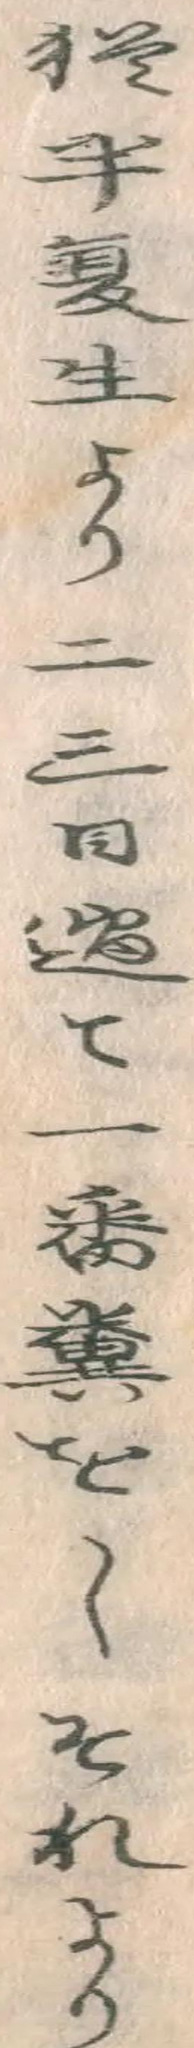猶半夏生より二三日過て一番糞をしそれより
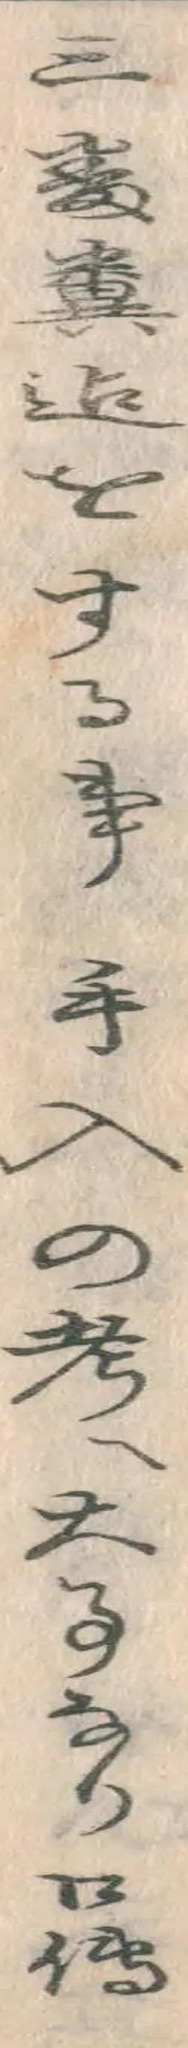三番糞迄をする事手入の考へ大事なり口伝
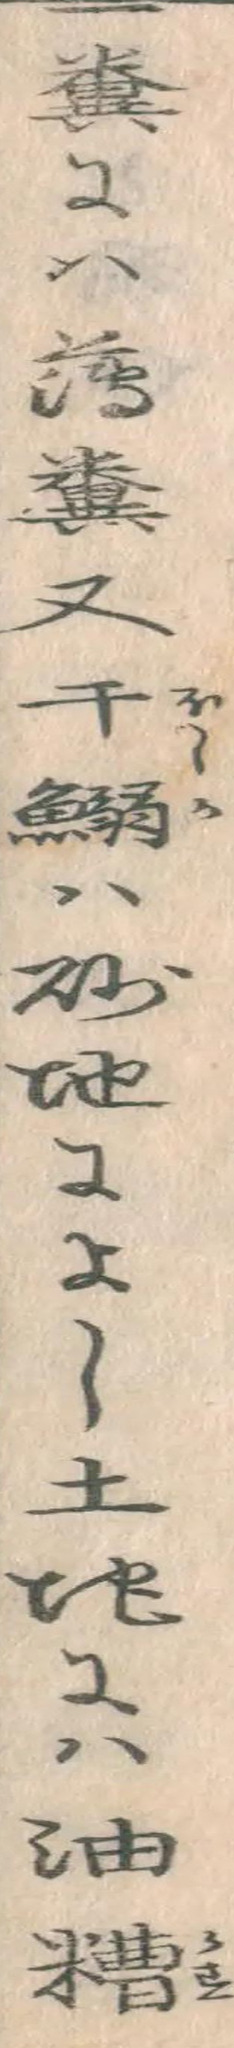一糞には薄糞又干鰯は砂地によし土地には油糟
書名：機織彙編 5巻. [1]
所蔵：国立国会図書館 National Diet Library, JAPAN
